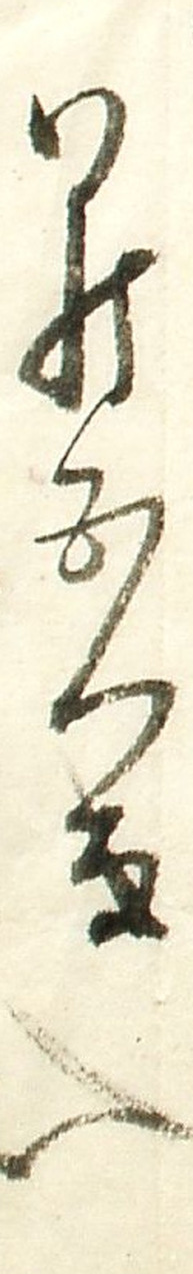同村五人与
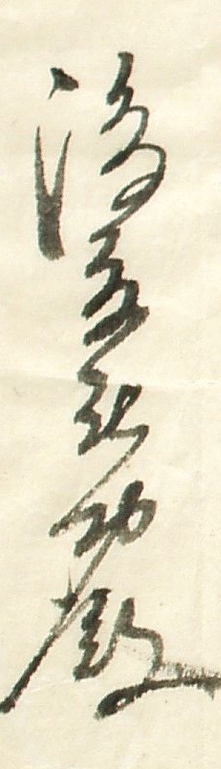後藤庄助殿

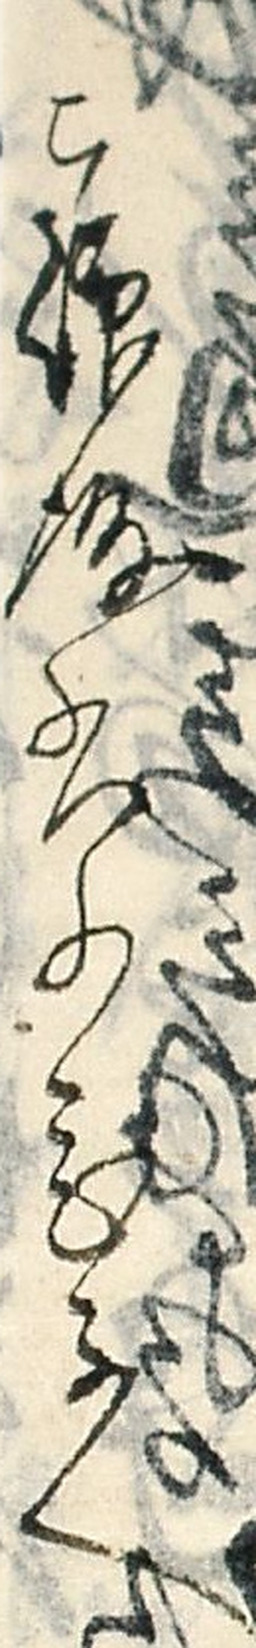被仰渡書のひかへ

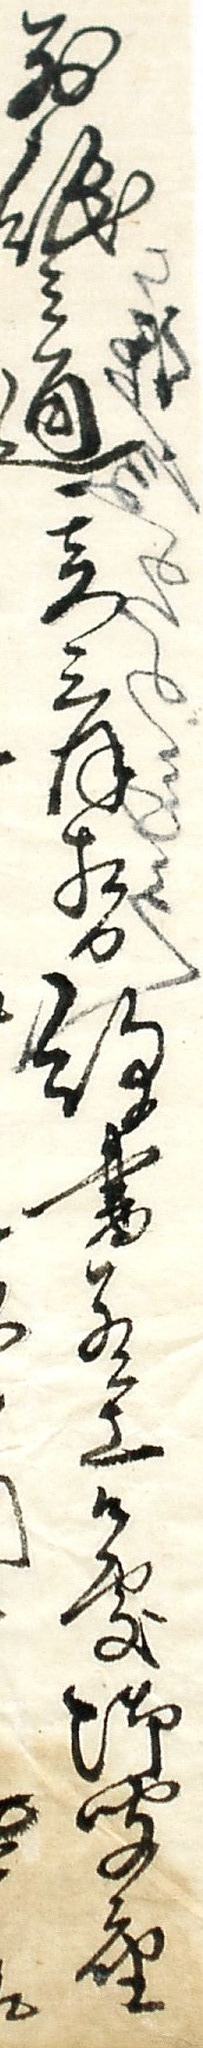別紙之通亥三月十九日約メ書差上候處御聞届
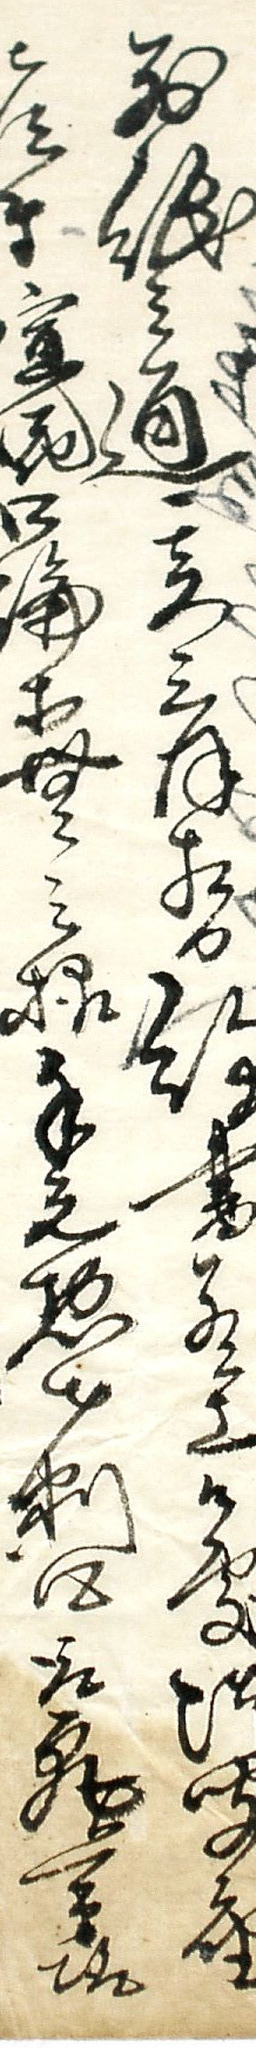被仰付喧嘩口論等無之様手元惣才判仕取究メ可申趣
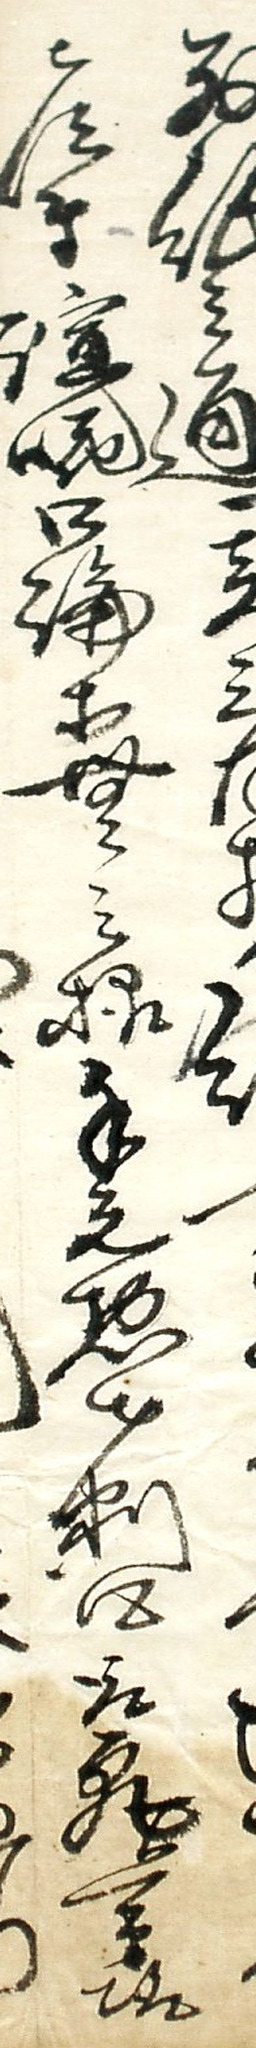被仰付喧嘩口論等無之様手元惣才判仕取究メ可申趣
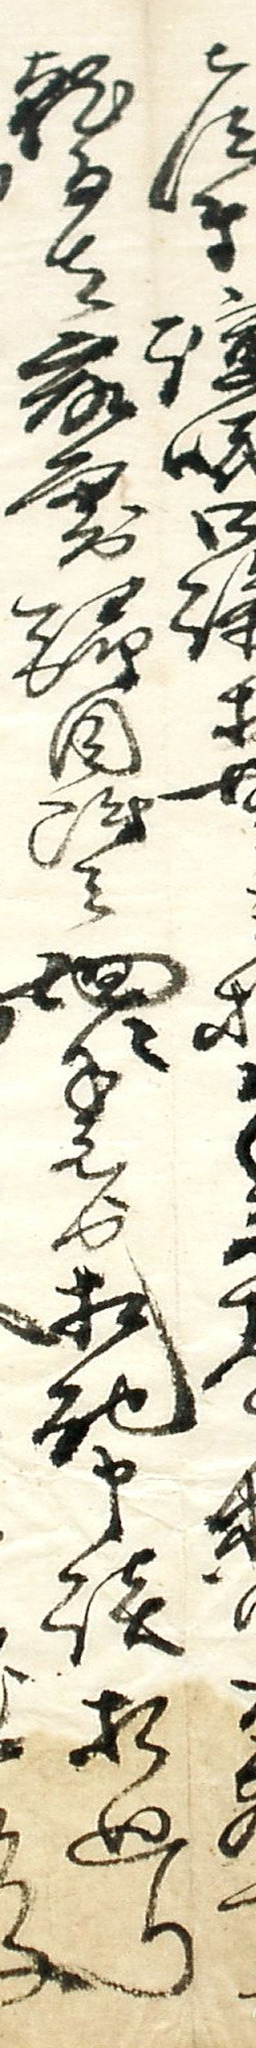就而者最寄歸目附之面々手元ゟ相配申談打廻り
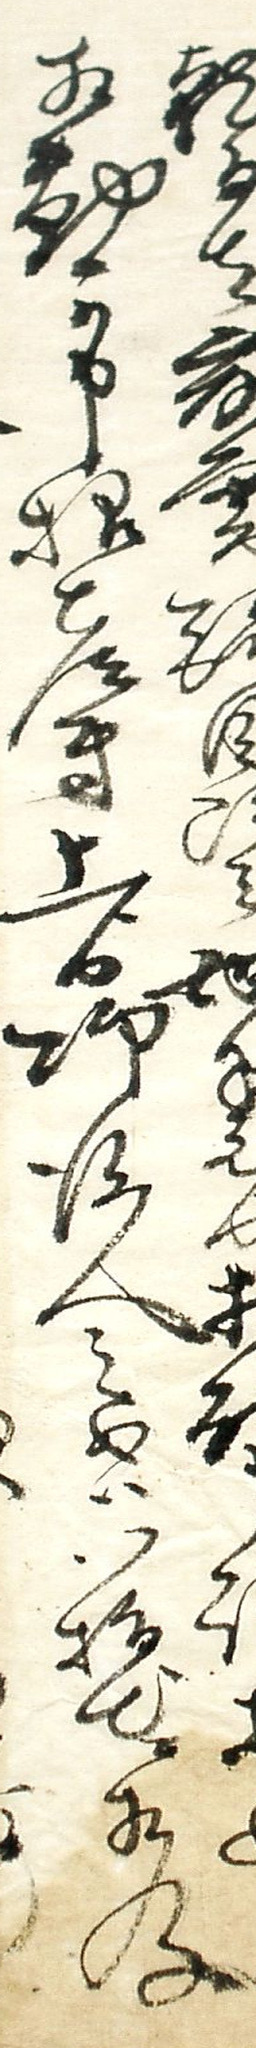相勤可申様被仰付上ゟ御役人之義ハ御指出ニ相及
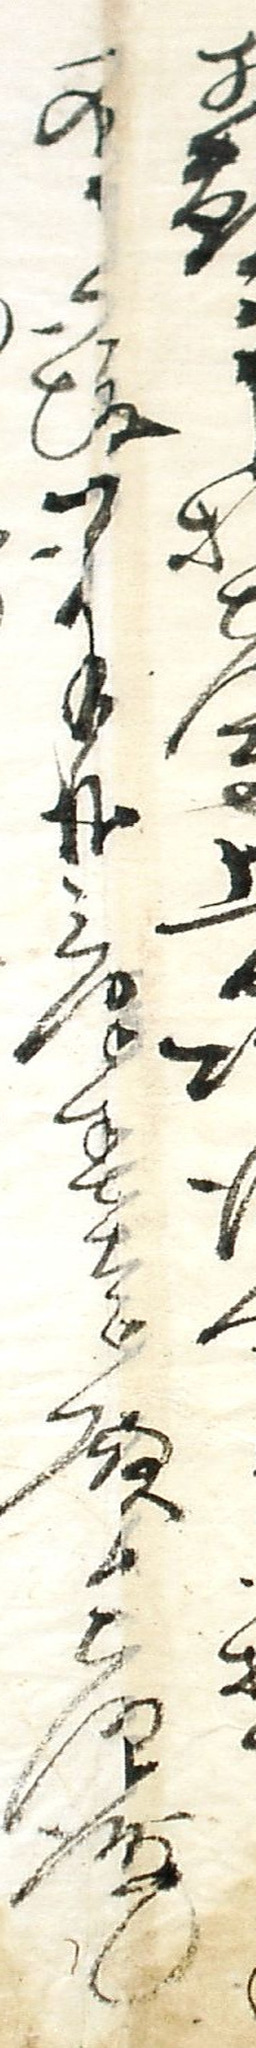不申御趣御手代三澤春太郎殿被仰渡候
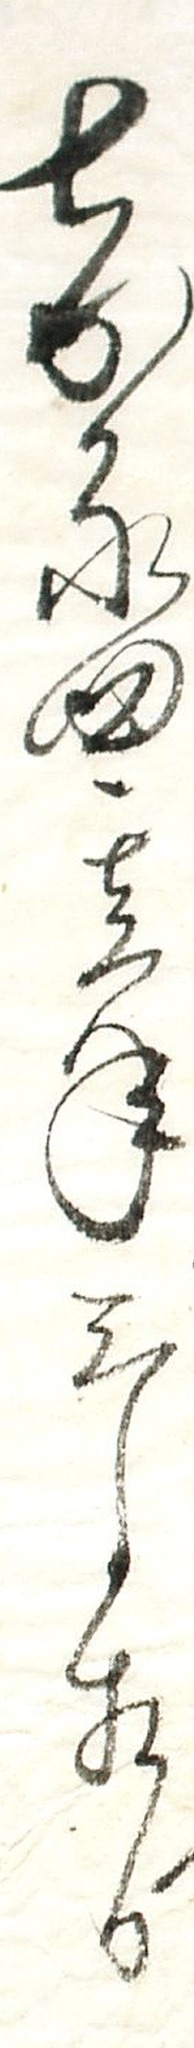嘉永四亥年三月十九日

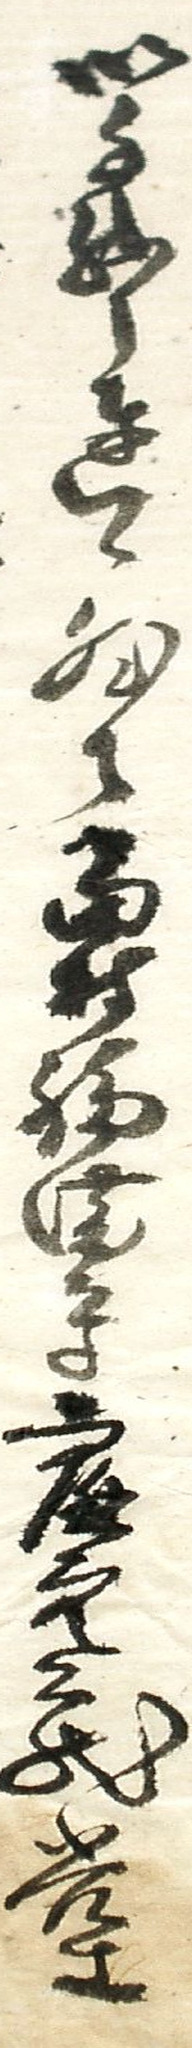以手紙申達候然者當村福満寺虚空蔵堂
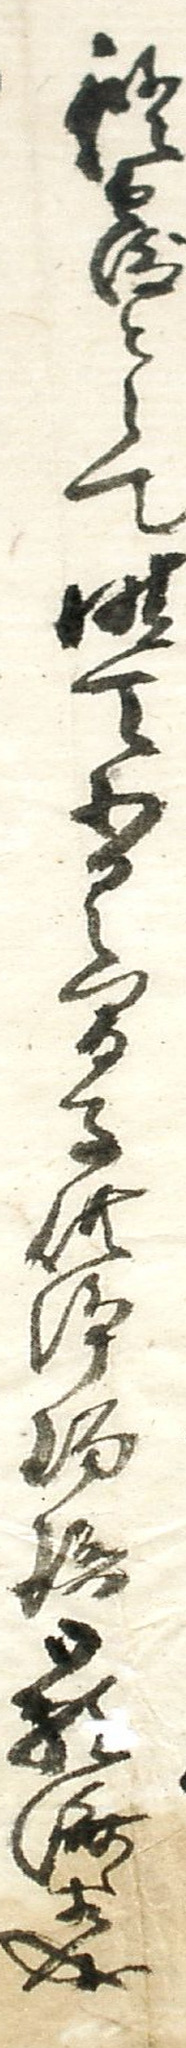修覆として晴天五日之間子供浄瑠璃御願濟ニ相成
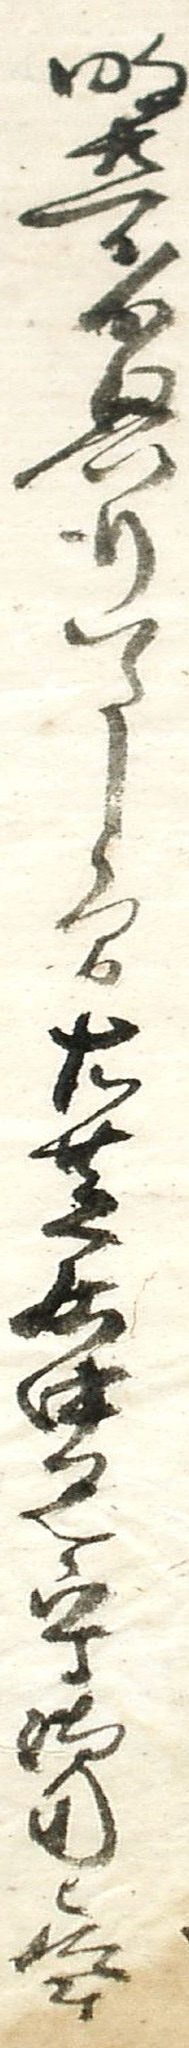明廿一日ゟ興行いたし候間右芝居中見守御用被仰付
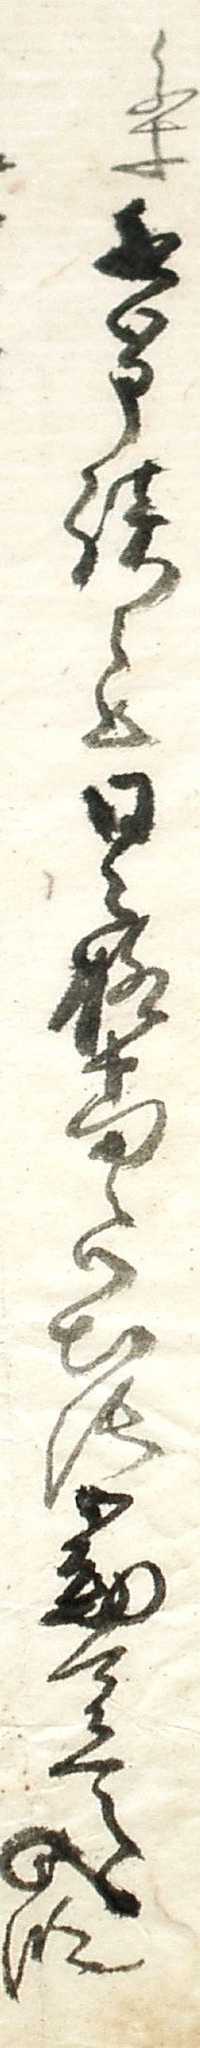候条各御申談之上日々極番之御出張御勤可有之候此段
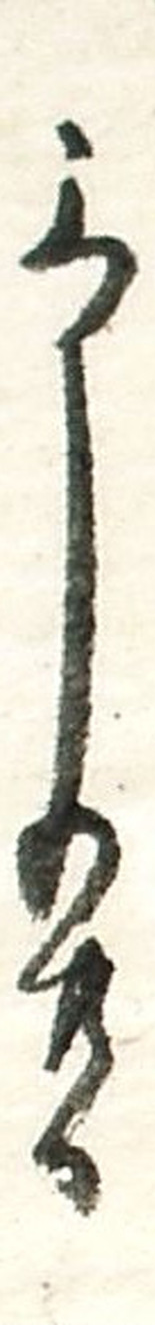三月廿日
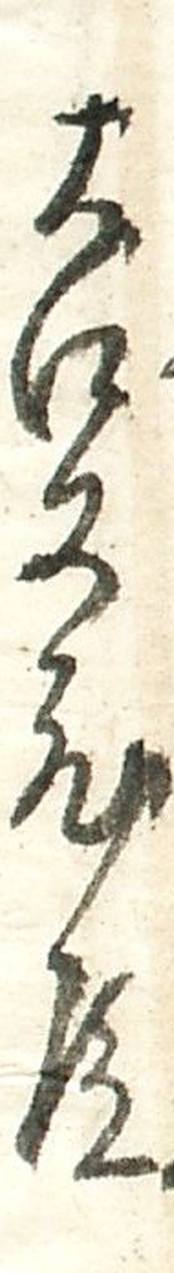大江又蔵殿
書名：(早渕村福満寺子ども浄瑠璃願紙面）他
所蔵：鳴門教育大学 Naruto University of Education
